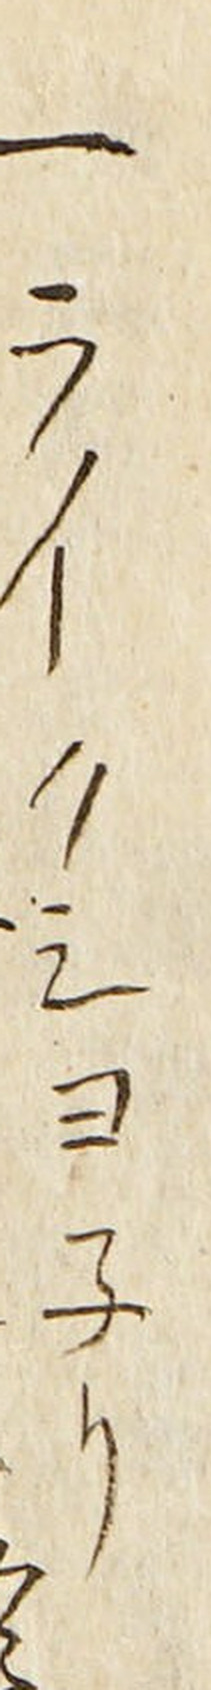一ライクシヨネリ
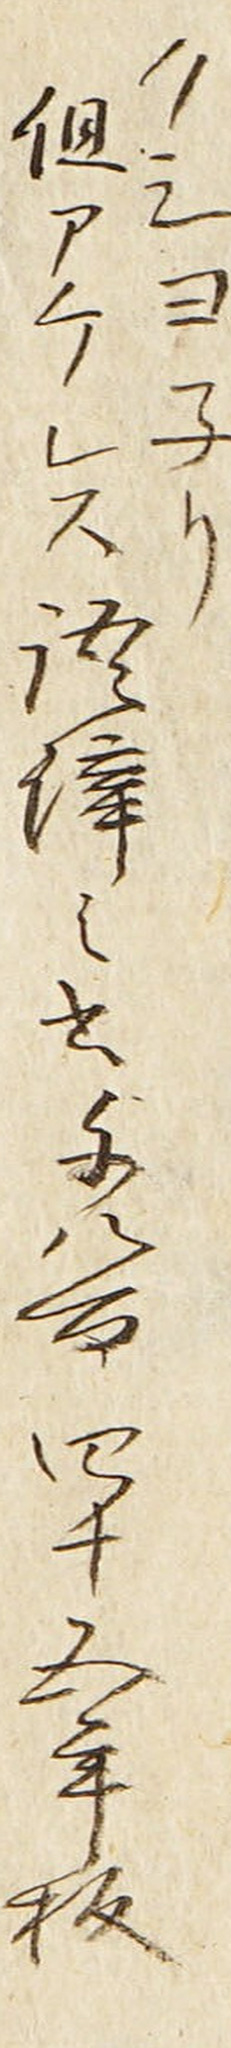但アケレス語辞之書千八百四十五年板一冊
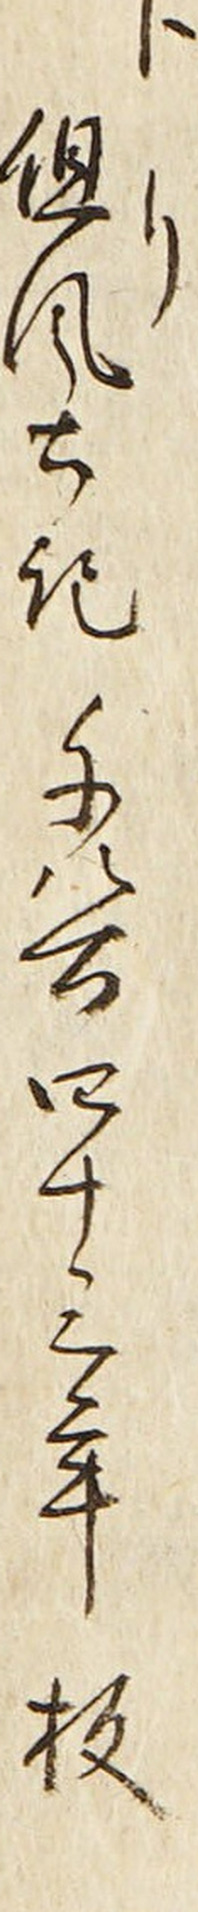但風土記千八百四十三年板一冊
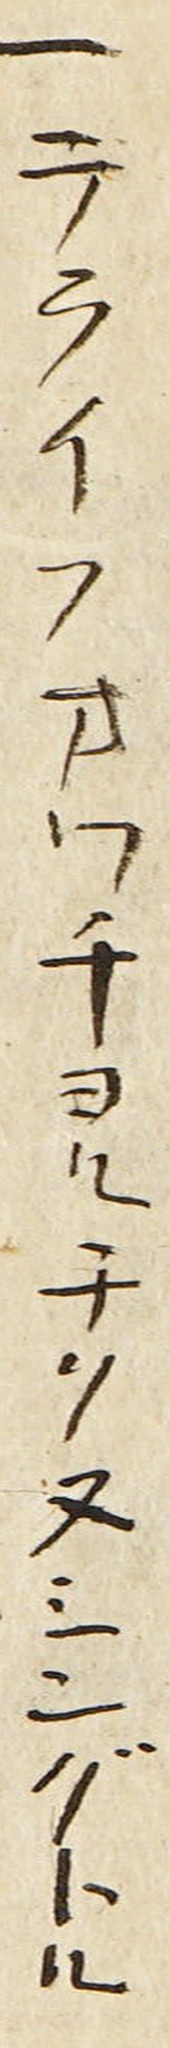一テライフオワチヨルチクヌシングトル一冊
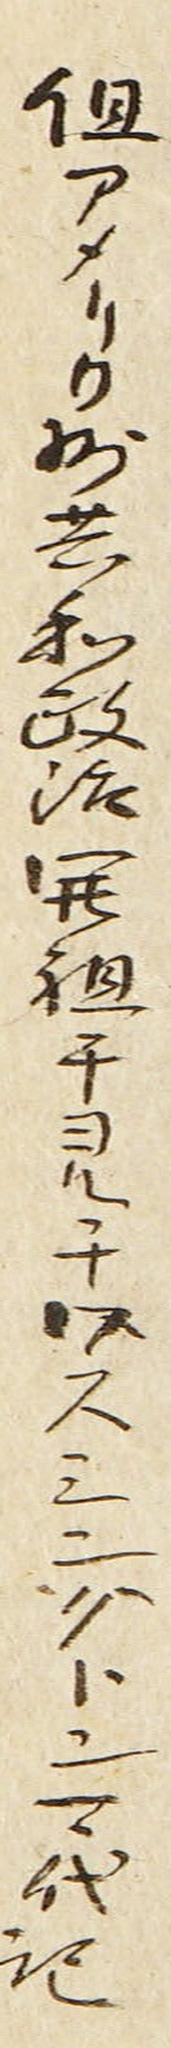但アメリカ州共和政治開祖チヨルチワスシングトンマ代記

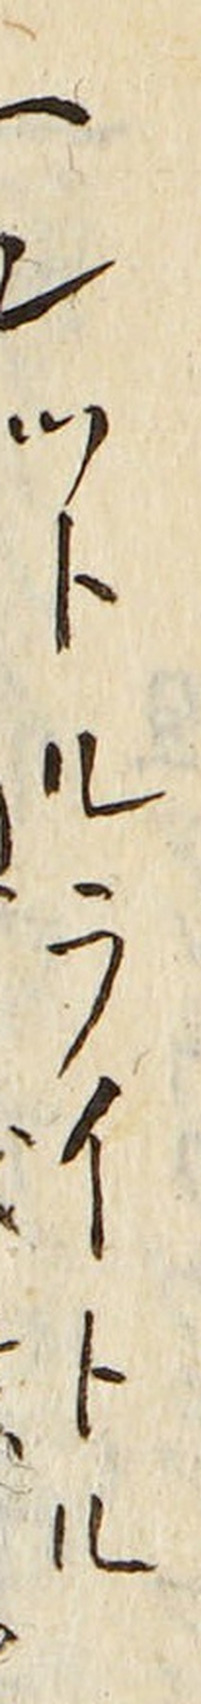一レツトルライトル
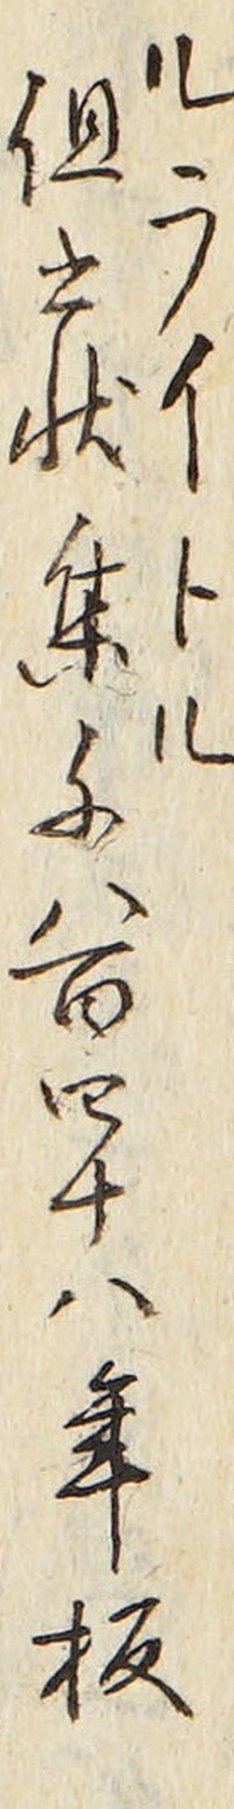但書状集千八百四十八年板
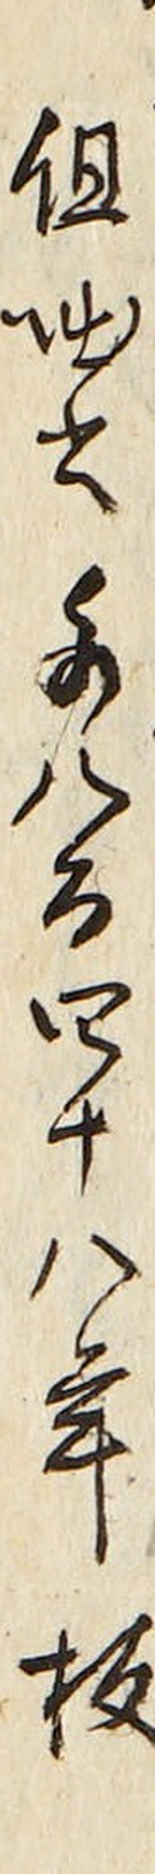但書状集千八百四十八年板
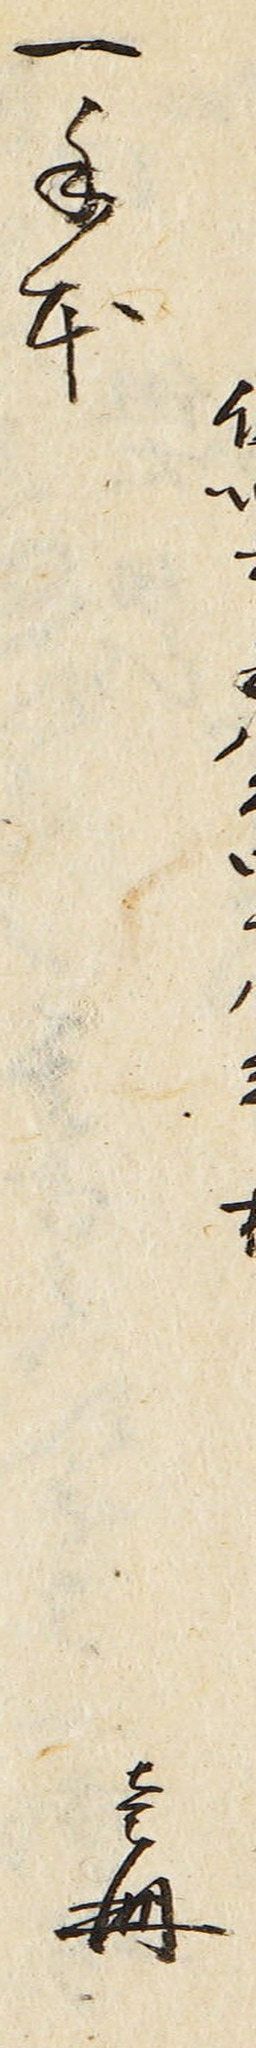一手本壱冊
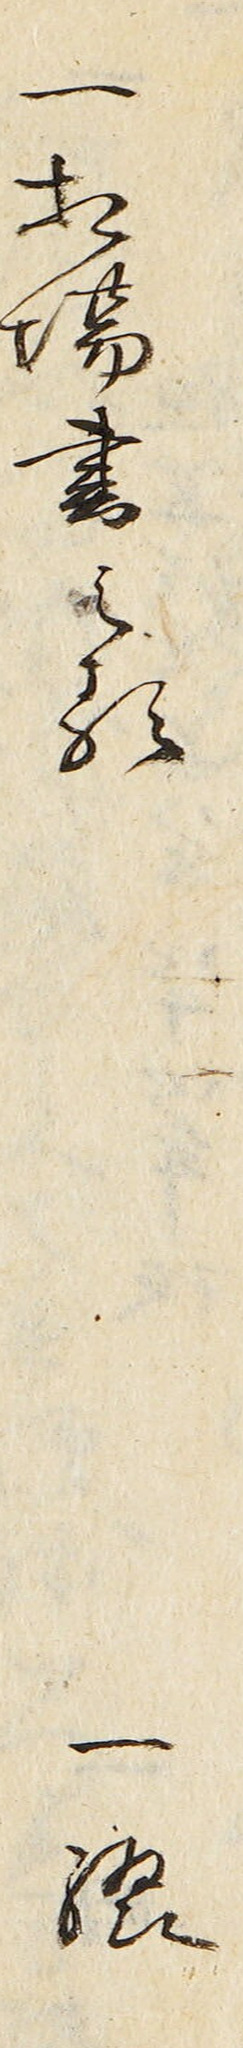一相場書之類一綴
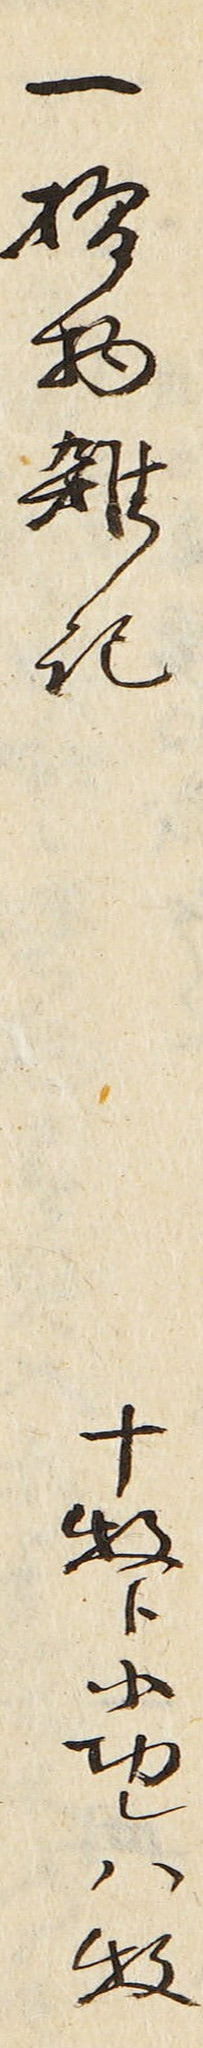一摺物雑記十枚ト小切レ八枚
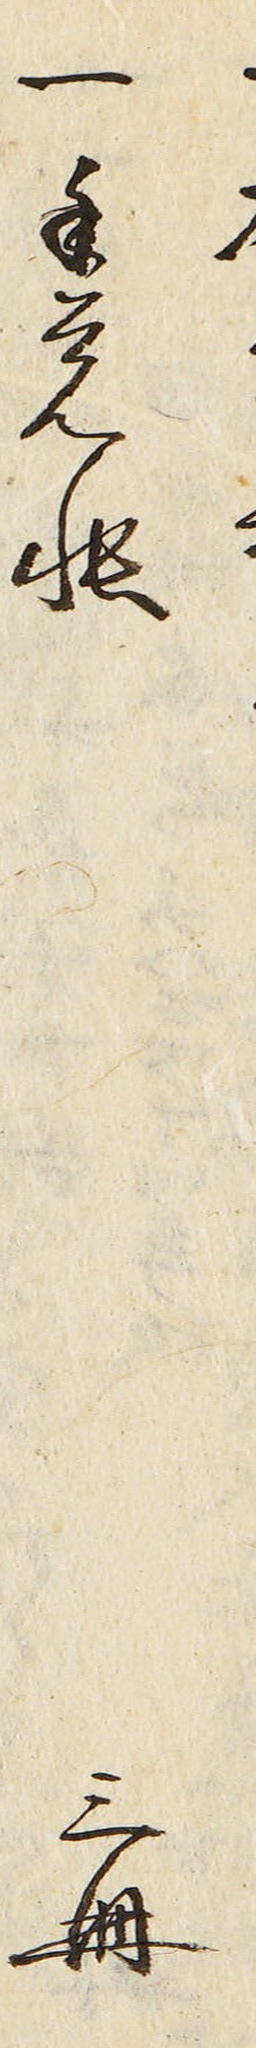一手覚帳三冊
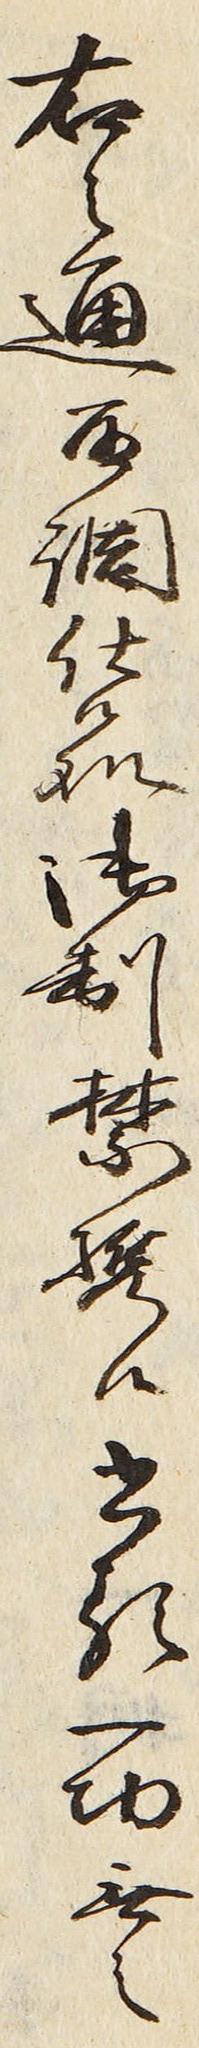右之通取調仕候処御制禁携候書類一切無之
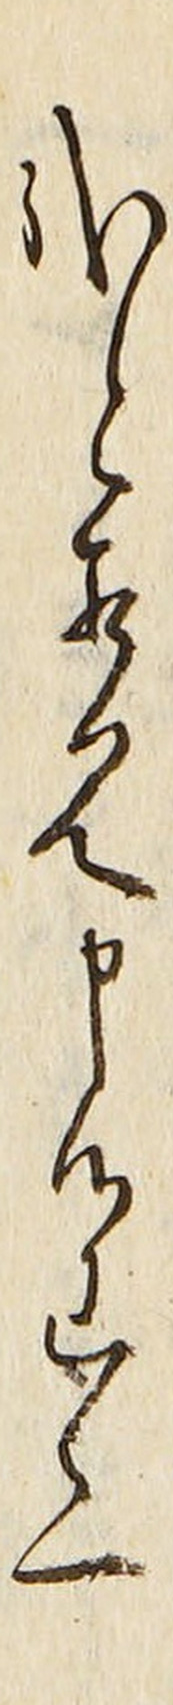哉と相見申候已上
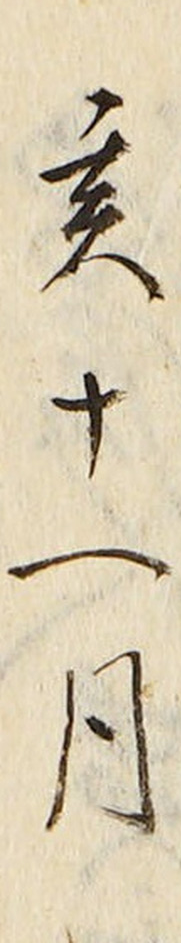亥十一月
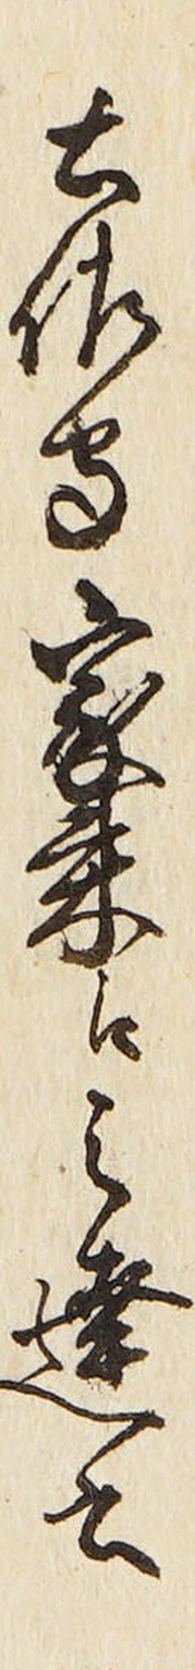土佐守家来え之達書
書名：土佐中浜万次郎漂流記
